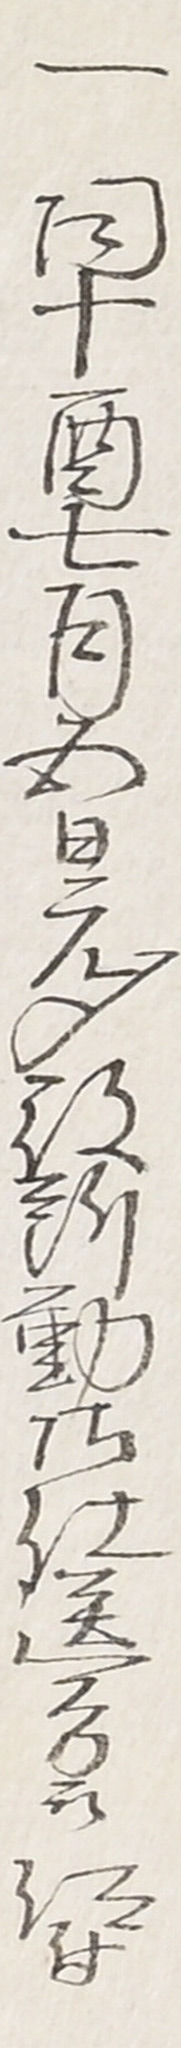一同十酉七月五日元〆役所勤御仕送方被仰付
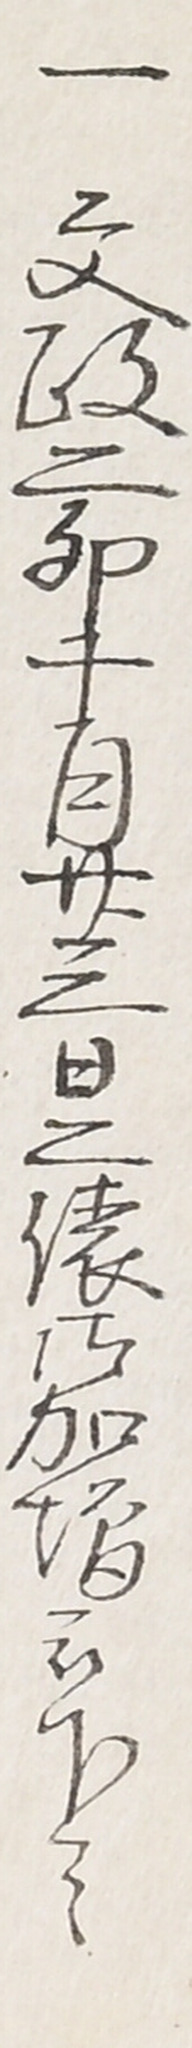一文政二卯十月廿三日二俵御加増被下之
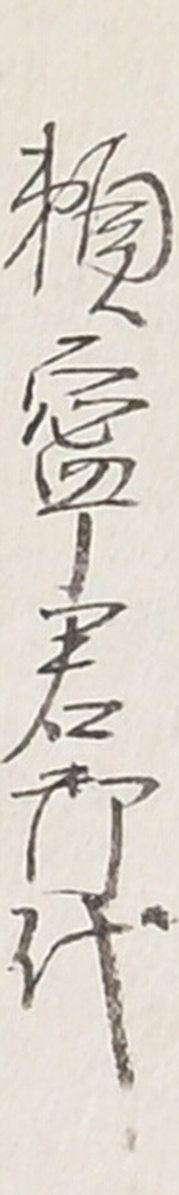頼寧君御代
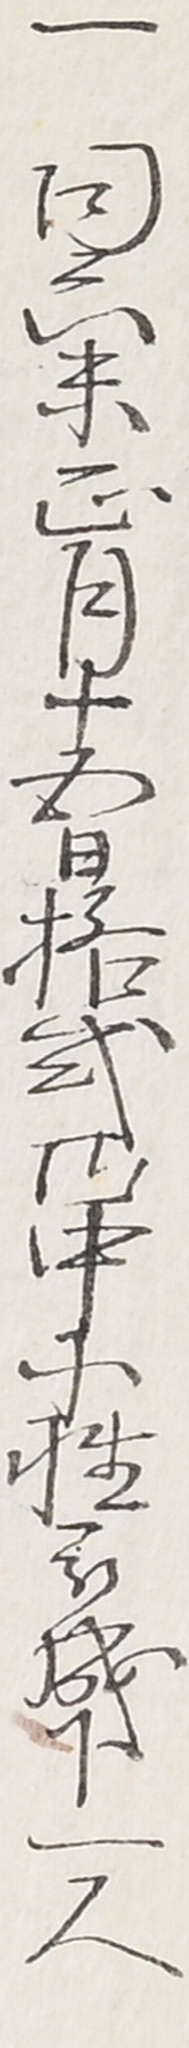一同六未正月十五日格式御中小性被成下一人
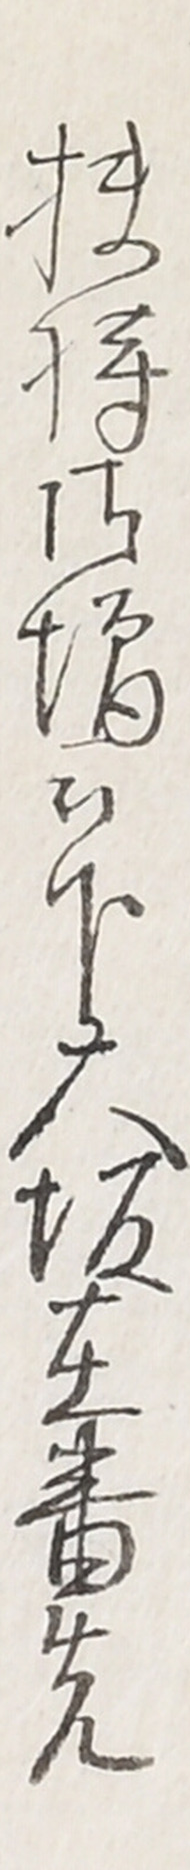扶持御増被下大坂在番先
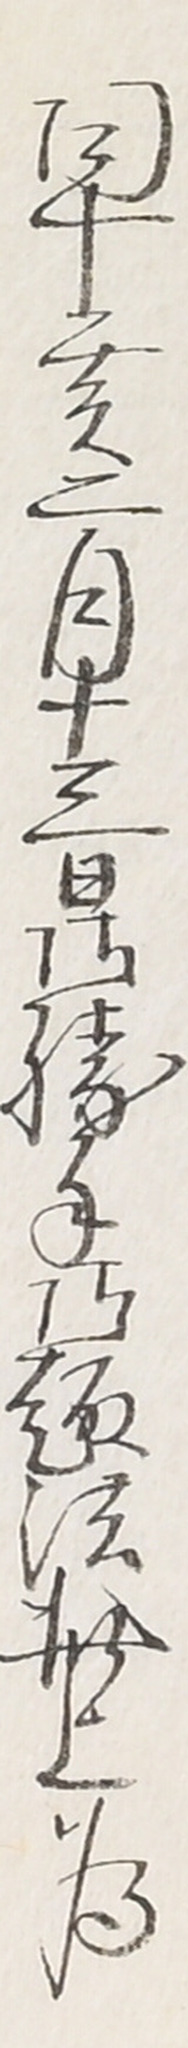一同十亥二月十三日御勝手御趣法此上為
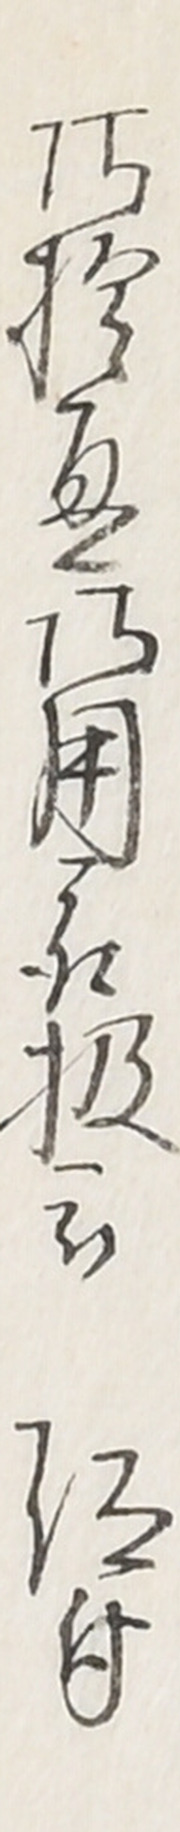御拾通御用取扱被仰付
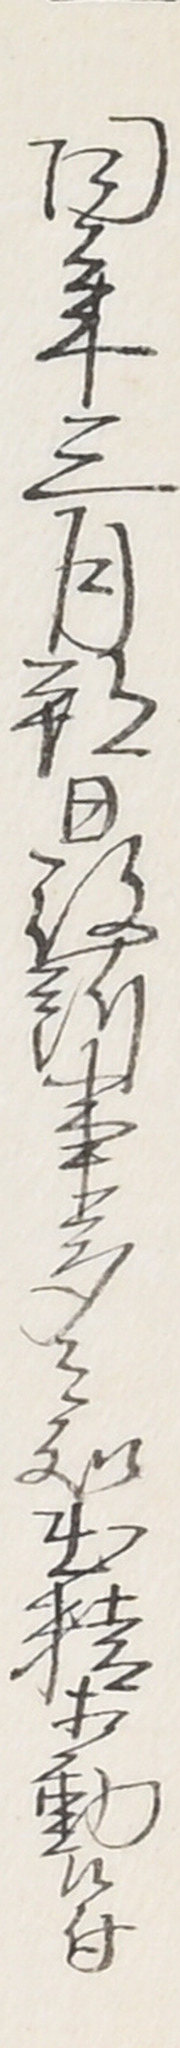一同年三月朔日役所事多之処出精相勤候付
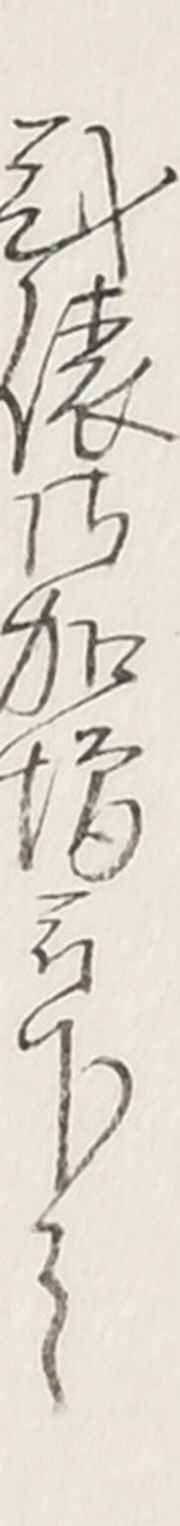弐俵御加増被下之
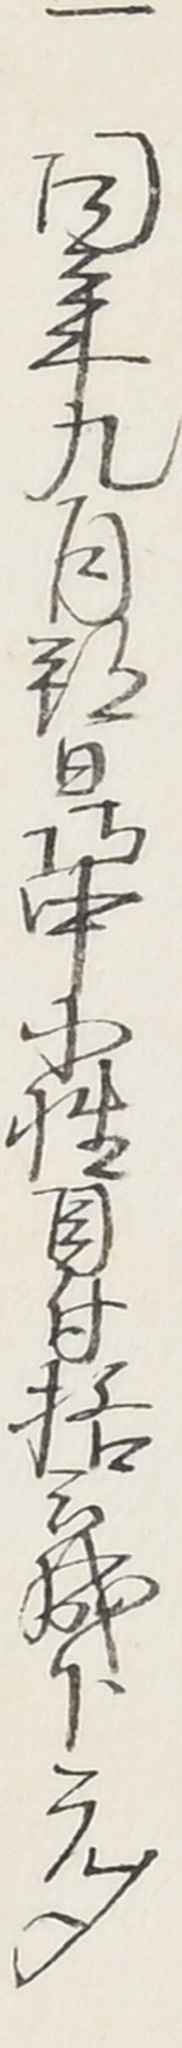一同年九月朔日御中小性目付格被成下元〆
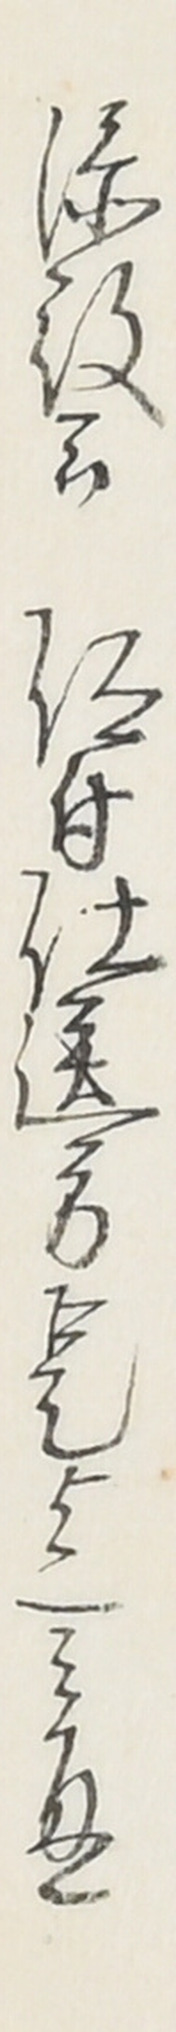添役被仰付仕送方是迄之通
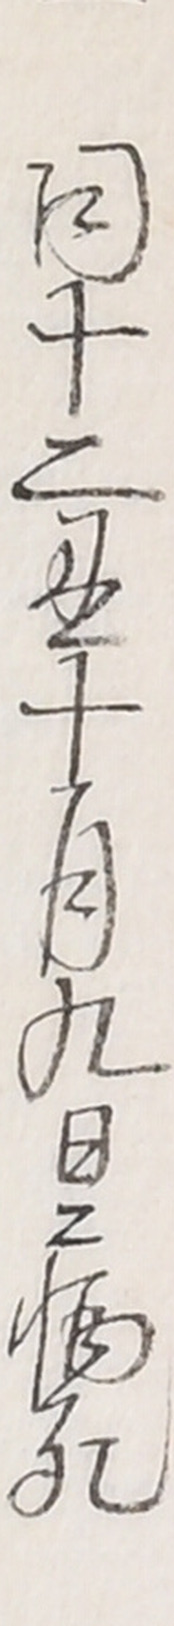一同十二丑十月九日病死
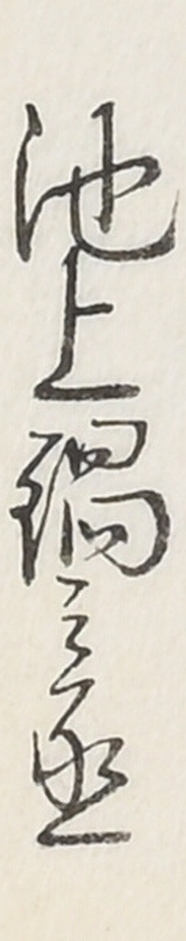池上鍋之丞
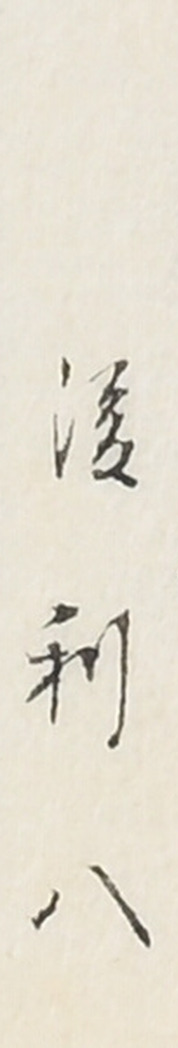後利八
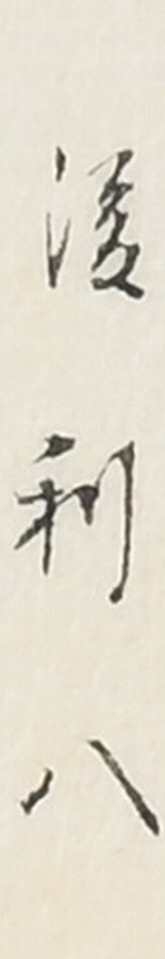後利八
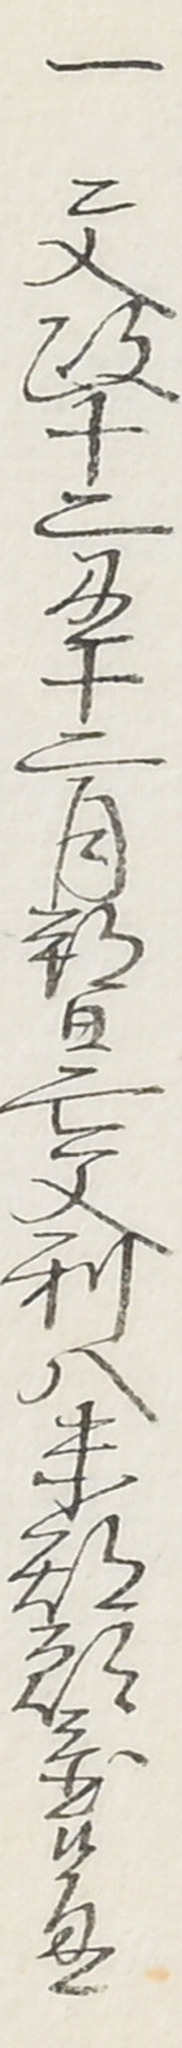一文政十二丑十二月朔日亡父利八末期願置候通
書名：無足諸士勤仕録（四）
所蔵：伊那市立高遠町図書館・合同会社AMANE
